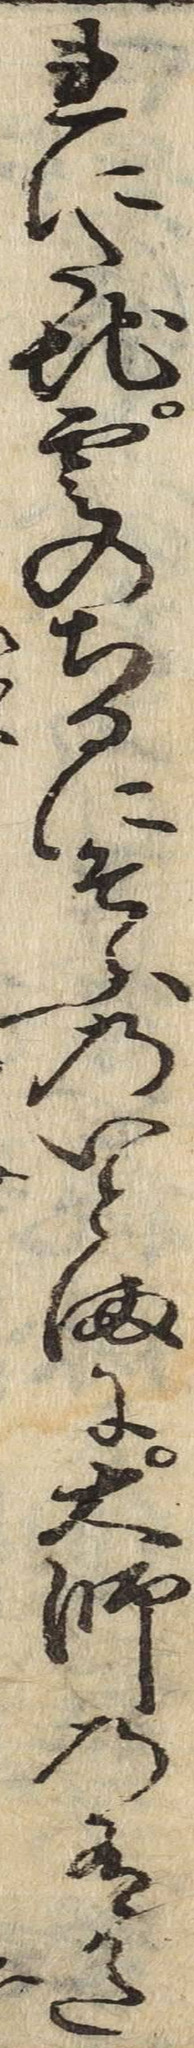れにたち。雪のちるにそふのいとまに。大師の有かた
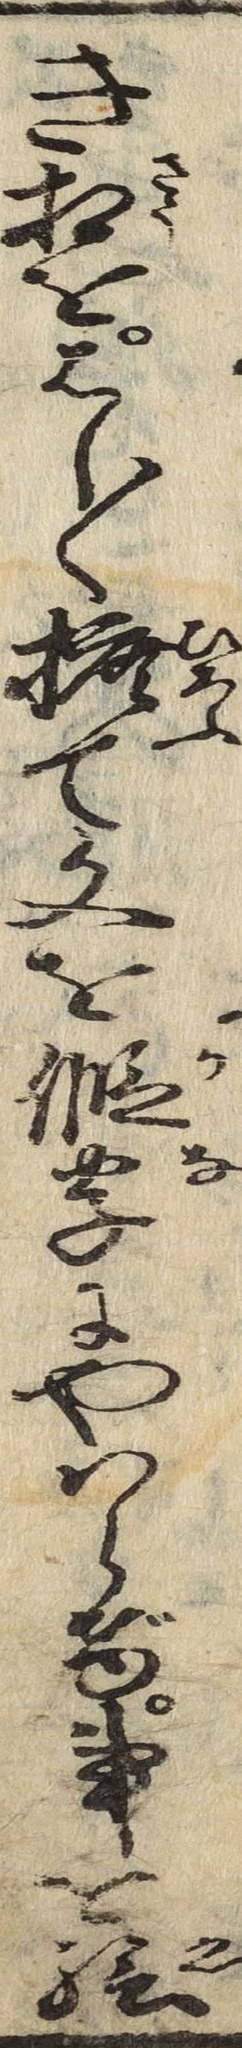き相をはし〳〵拾て文を仮名にやはらげ。事を絵
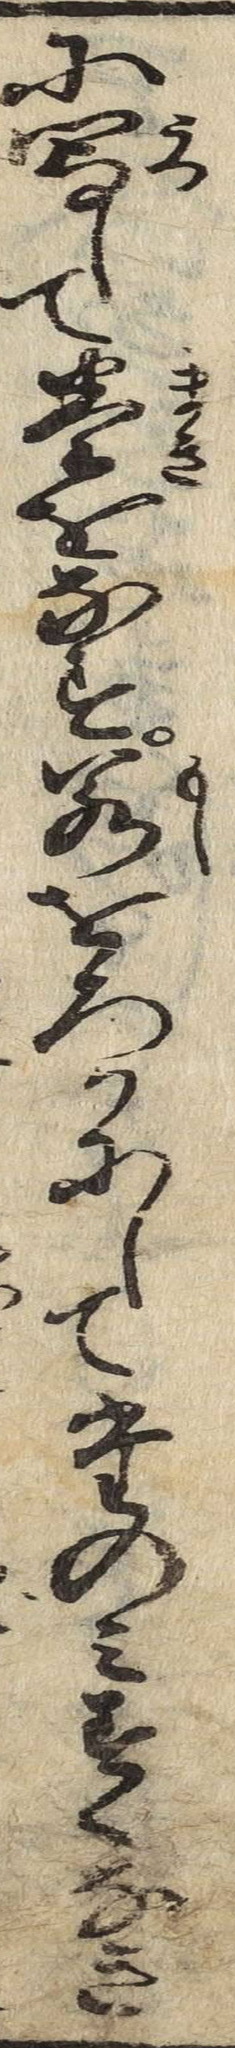に写して。巻をなす。若をろかにしてたのみすくなき
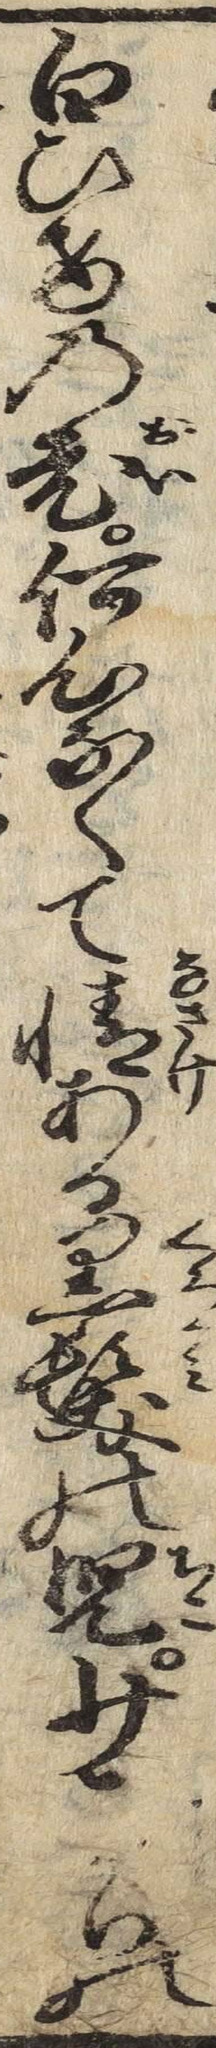白ひけの老。何心なくて情ある黒髪の児。かりの
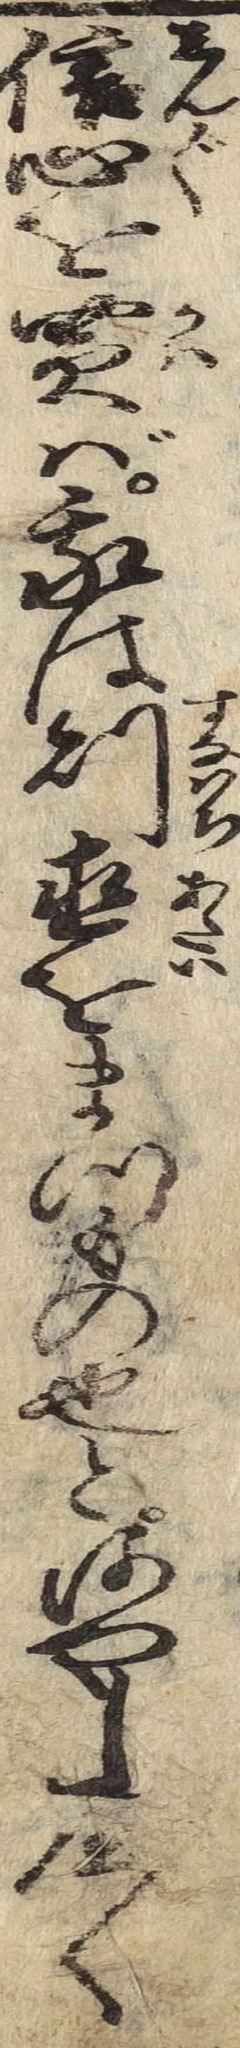信心を買ば。我は則直をまつもの也と。あやし〳〵
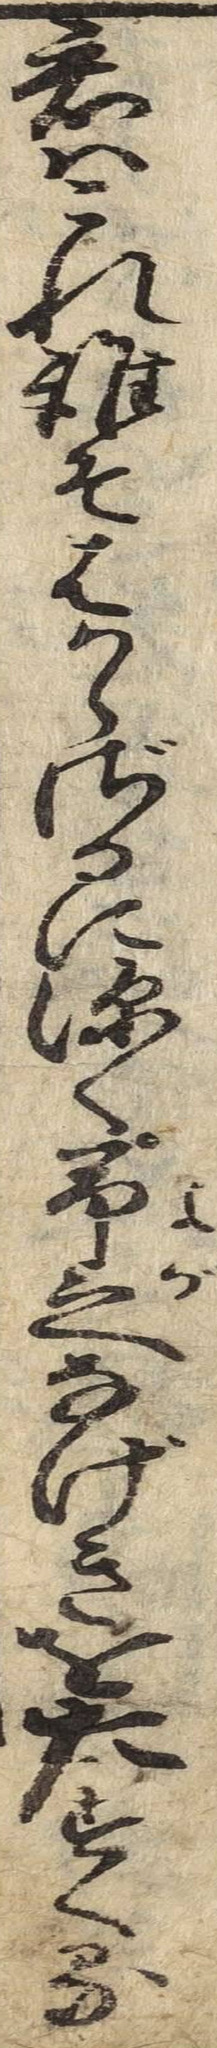君はこれ誰そはからざるに深く。予之なげきをたすくる

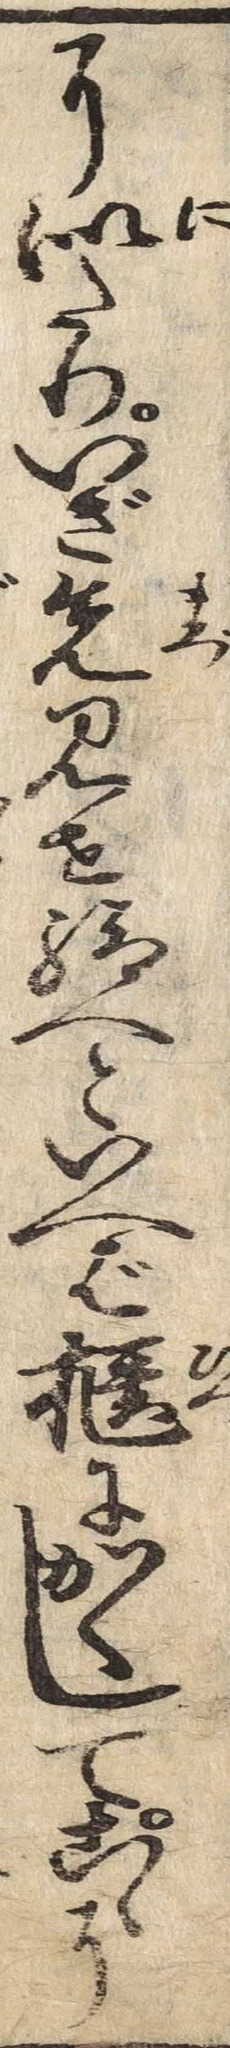に似たり。いざ先見せ給へといへば櫃にかくして。こゝに
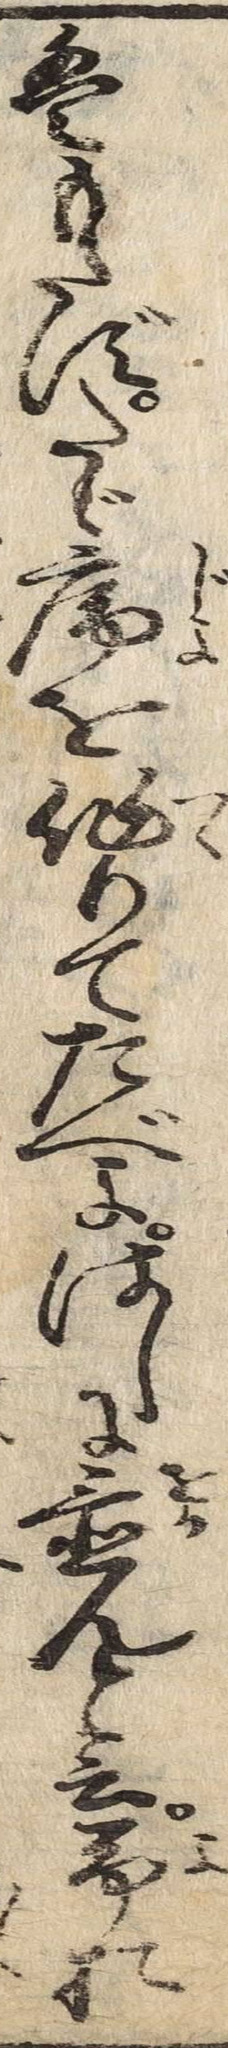はもたず。たゝ序を作りてたべよ。はしに置んと云。予お
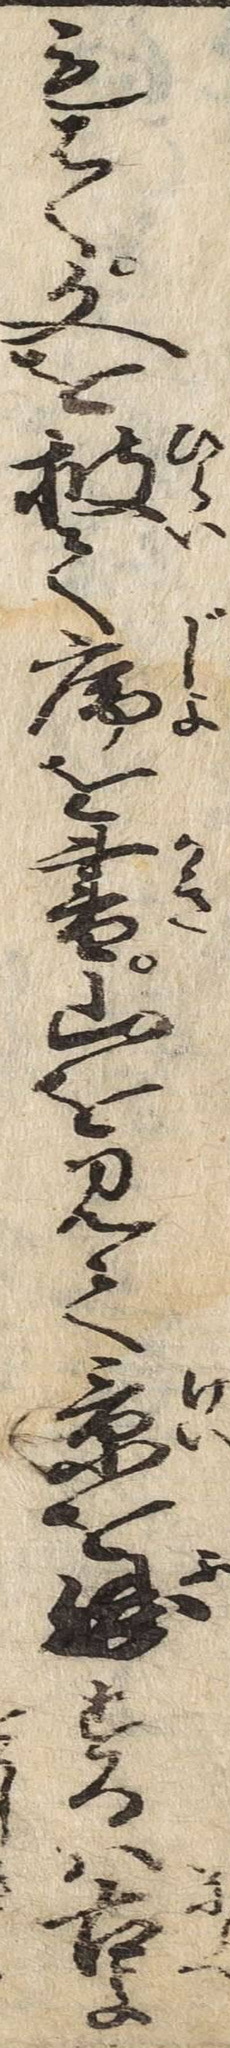もはく。文を披て序を書。山を見て景を賦するは古よ
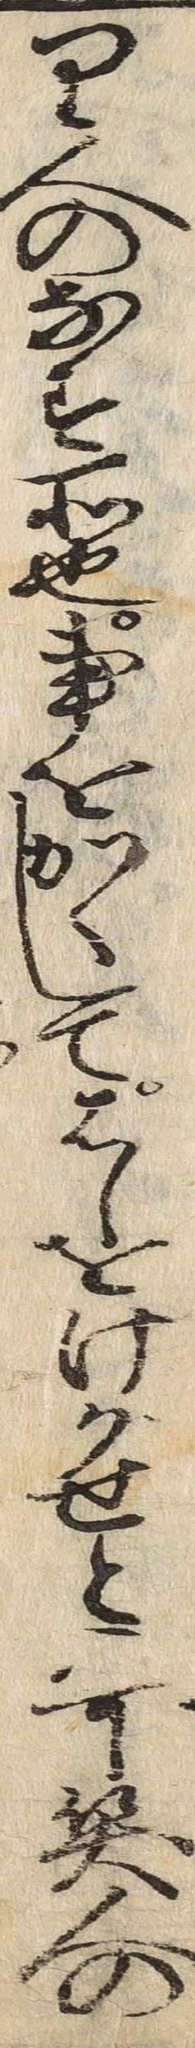り人のなす所也。事をかくして。はしをけかせとは可笑人の
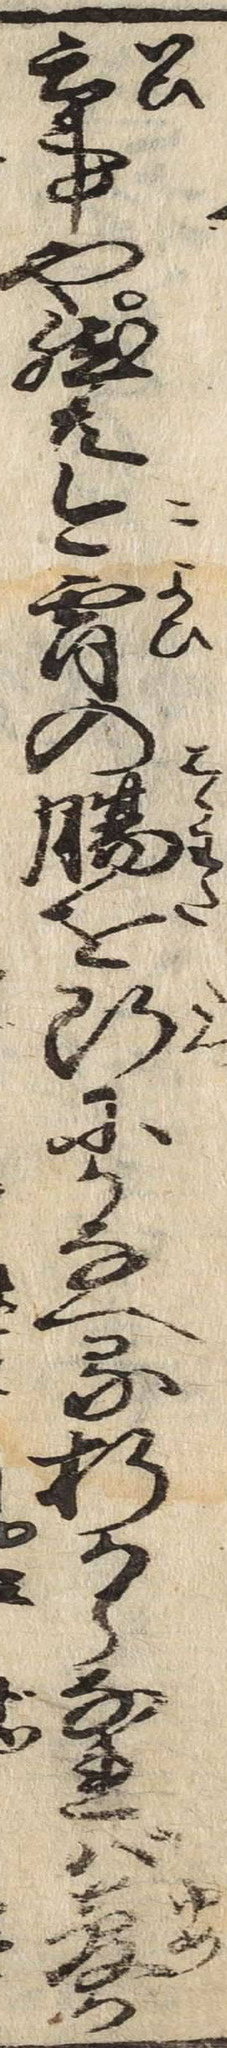云事や。然共今宵の腸を断にかなへる折からなれば夢か
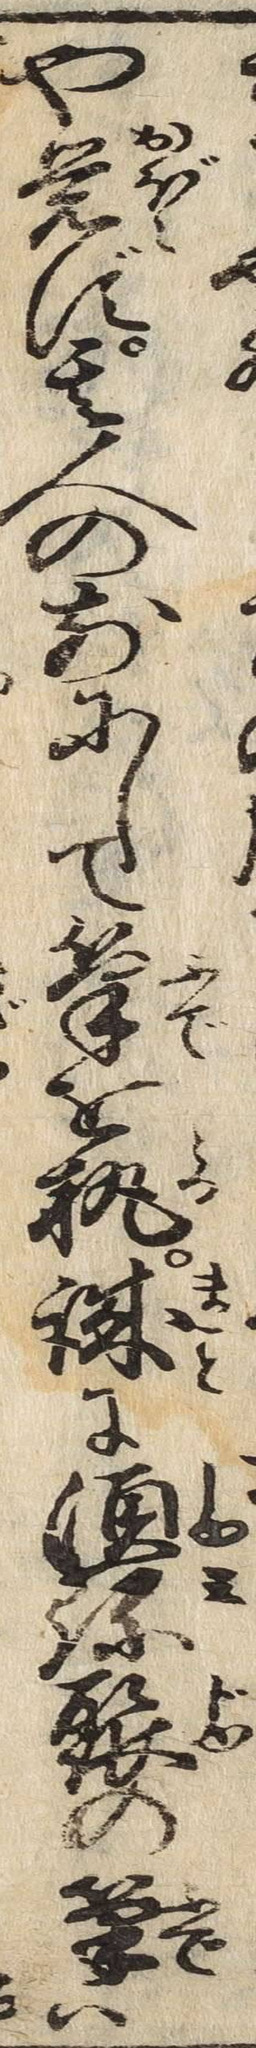や覚ず。其人の前にして筆を執。誠に須弥聚の筆は
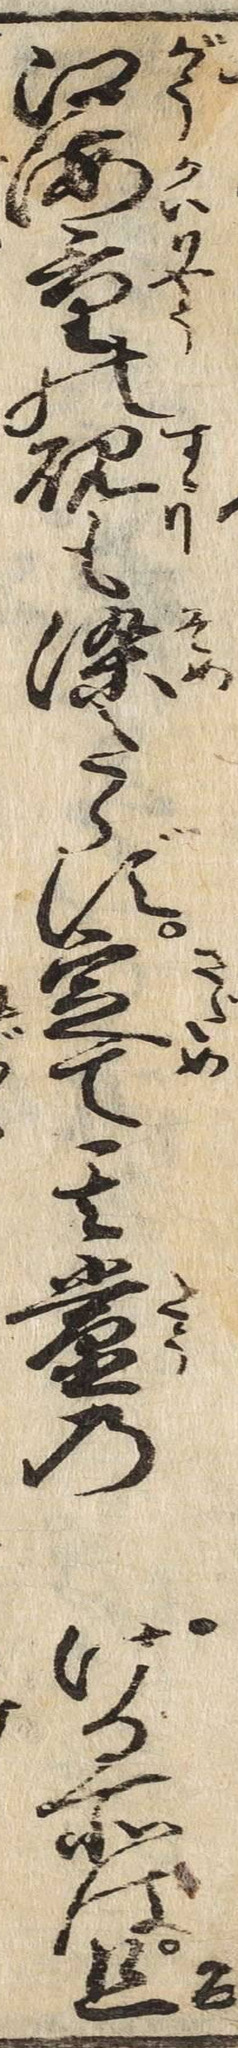江海量の硯も染たらず。定て其堂のける所は。且
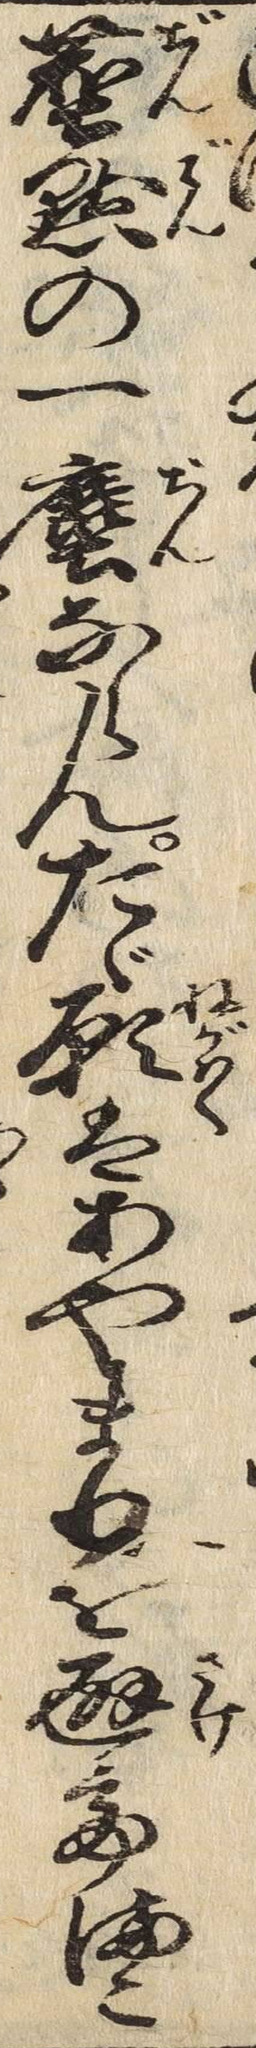塵点の一塵ならん。たゞ願はあやまりを避てまこ
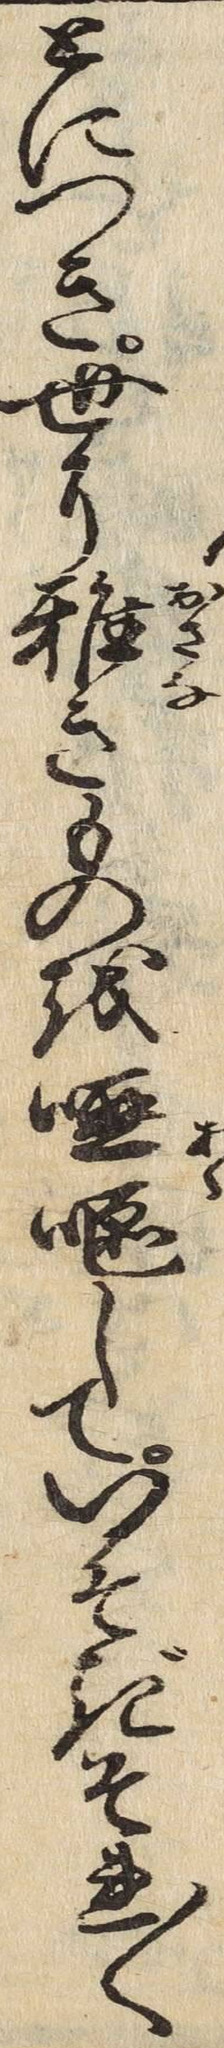とにつき。世に稚きものを唖嘔して。いそきそれ〳〵
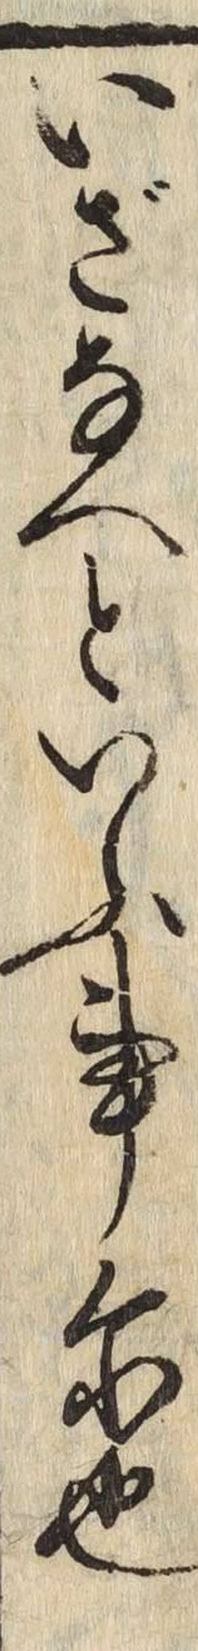いざなへといふ事尓也
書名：弘法大師御傳記
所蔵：京都府立京都学・歴彩館 国文学研究資料館
